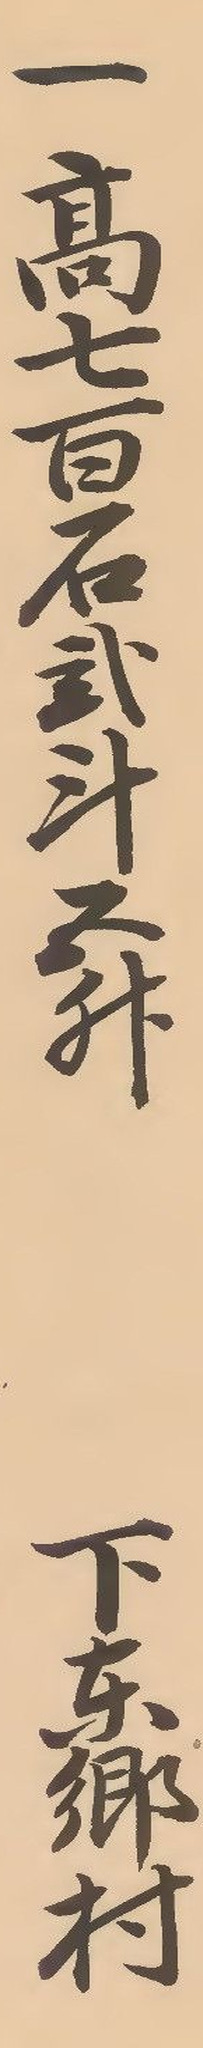一高七百石弐斗五升下東郷村
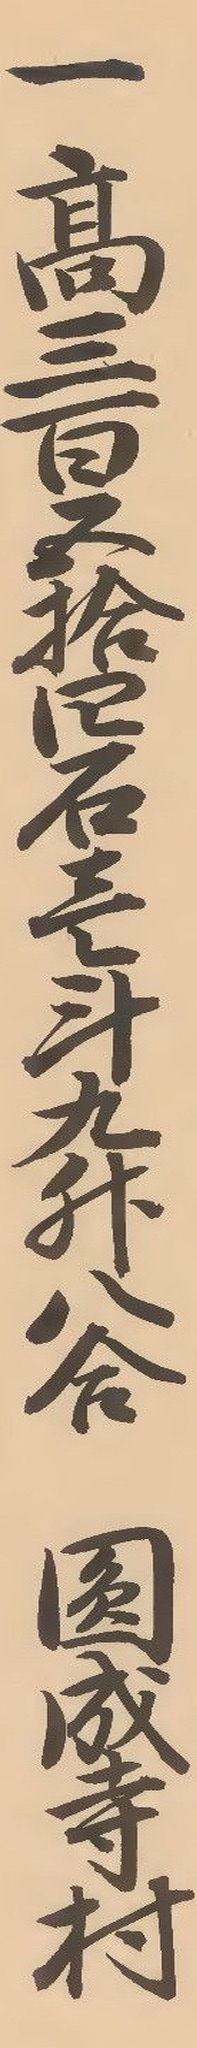一高三百五拾四石壱斗九升八合円成寺村
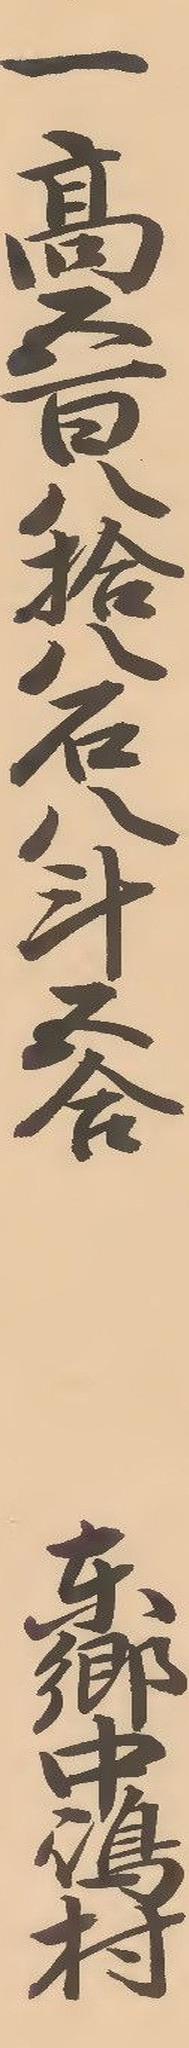一高五百八拾八石八斗五合東郷中島村
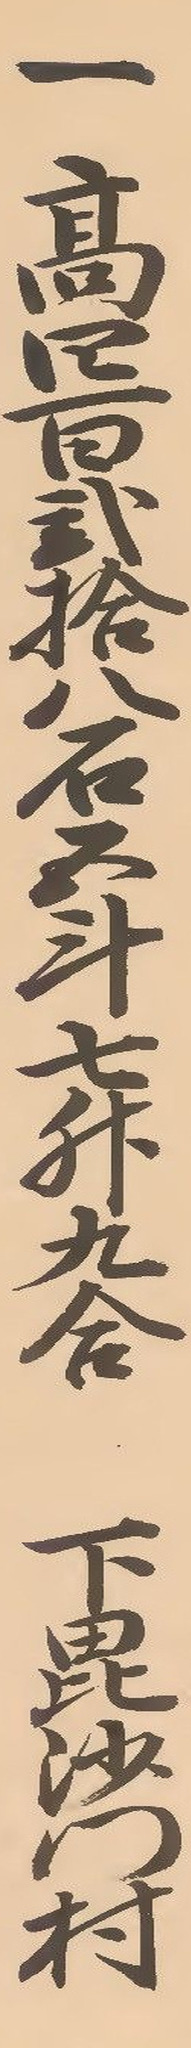一高四百弐拾八石五斗七升九合下毘沙門村
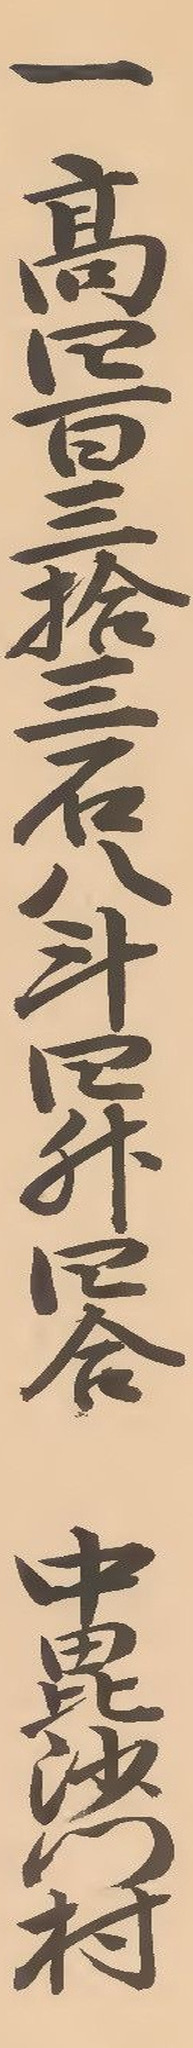一高四百三拾三石八斗四升四合中毘沙門村
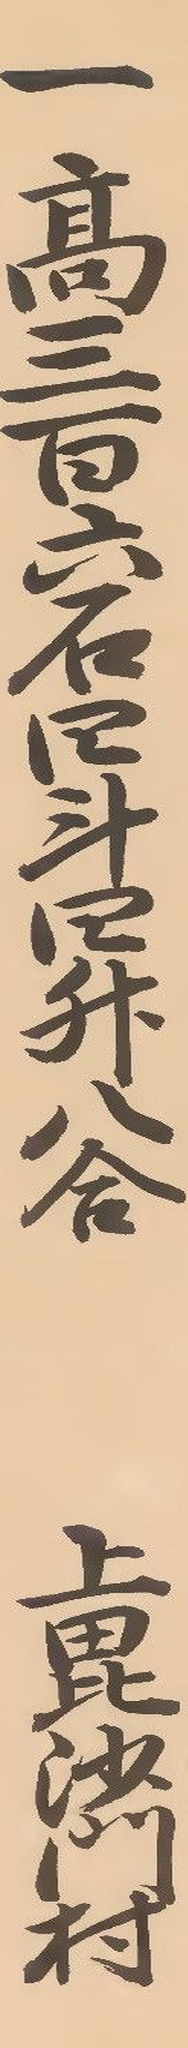一高三百六石四斗四升八合上毘沙門村
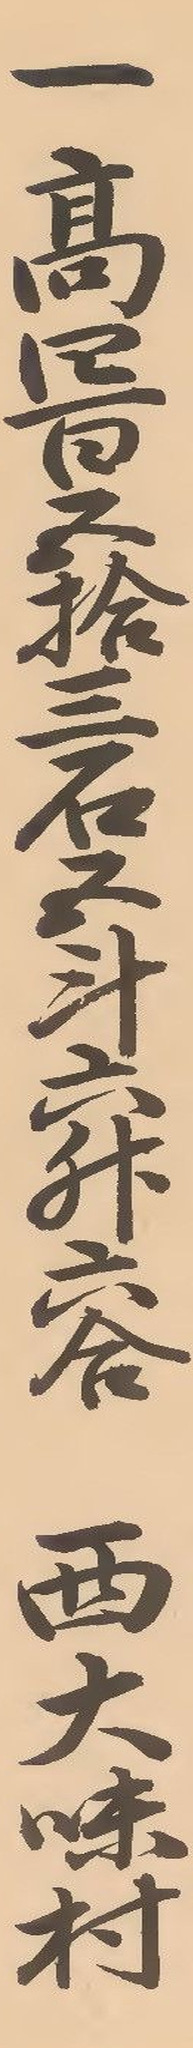一高四百五拾三石五斗六升六合西大味村

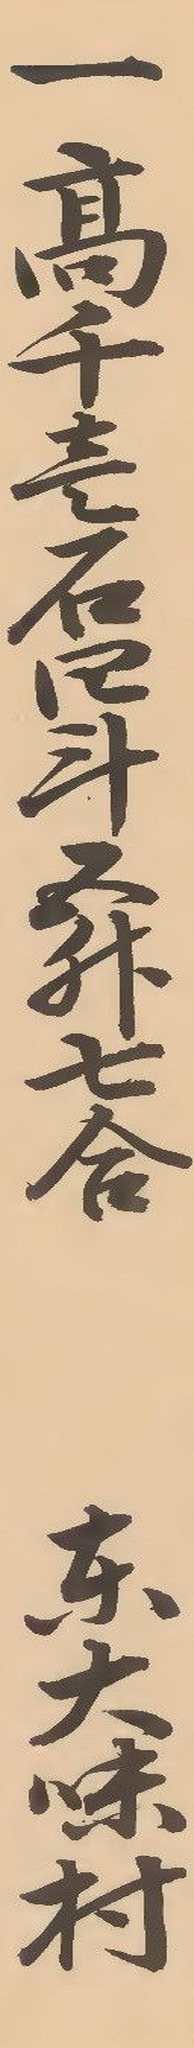一高千壱石四斗五升七合東大味村
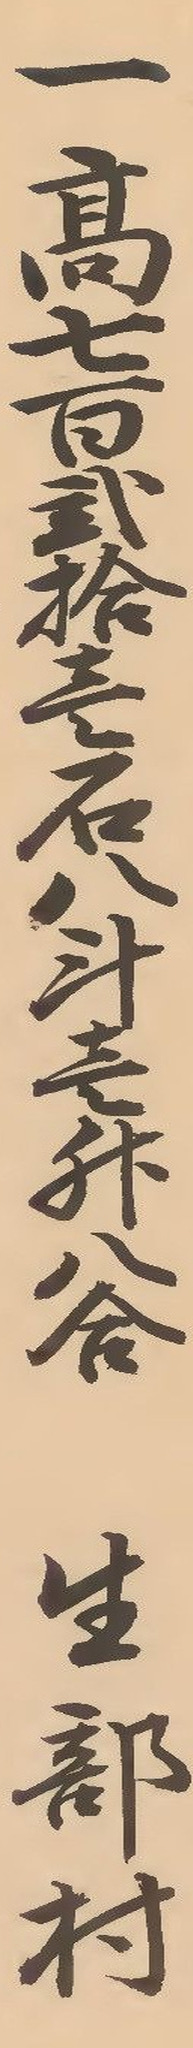一高七百弐拾壱石八斗壱升八合生部村
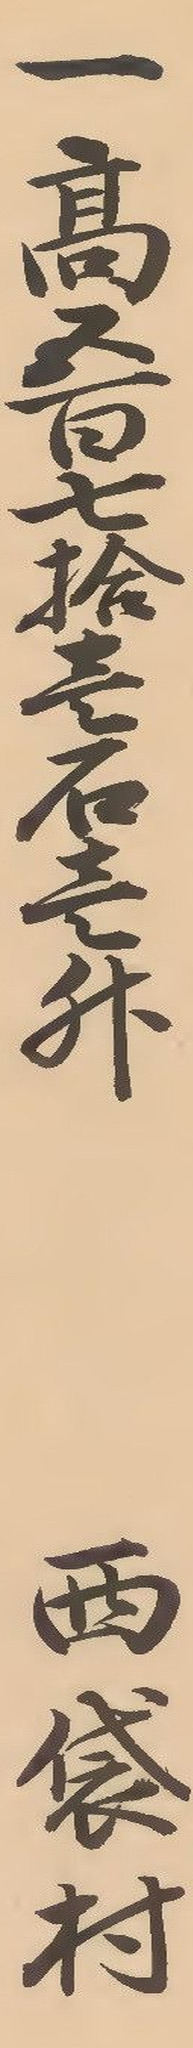一高五百七拾壱石壱升西袋村
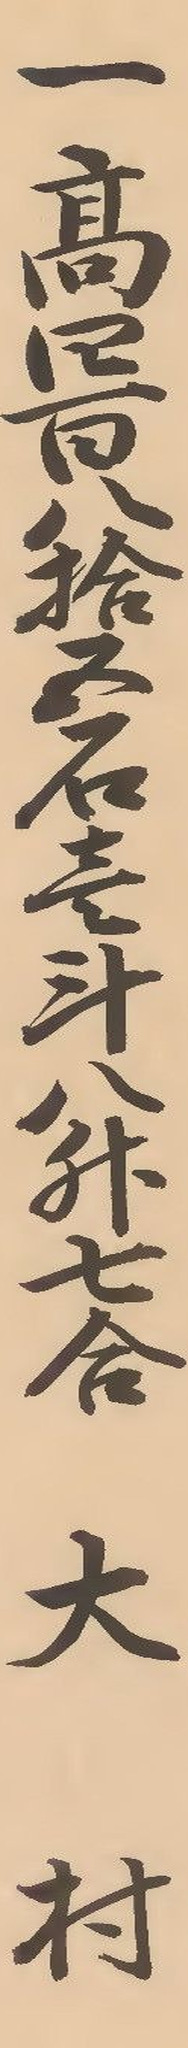一高四百八拾五石壱斗八升七合大村
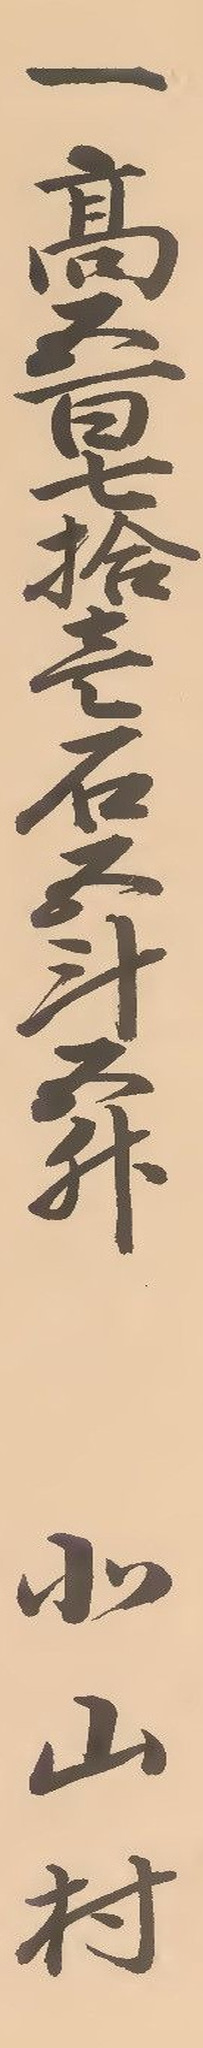一高五百七拾壱石五斗五升北山村
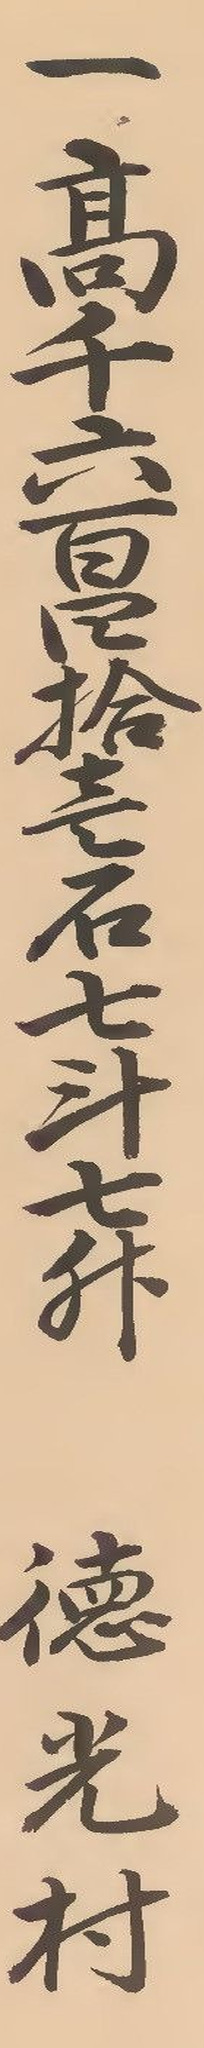一高千六百四拾壱石七斗七升徳光村
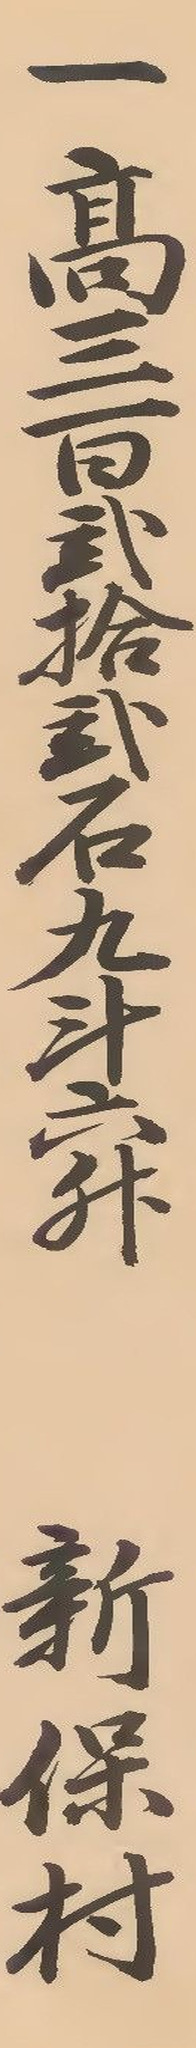一高三百弐拾弐石九斗六升新保村
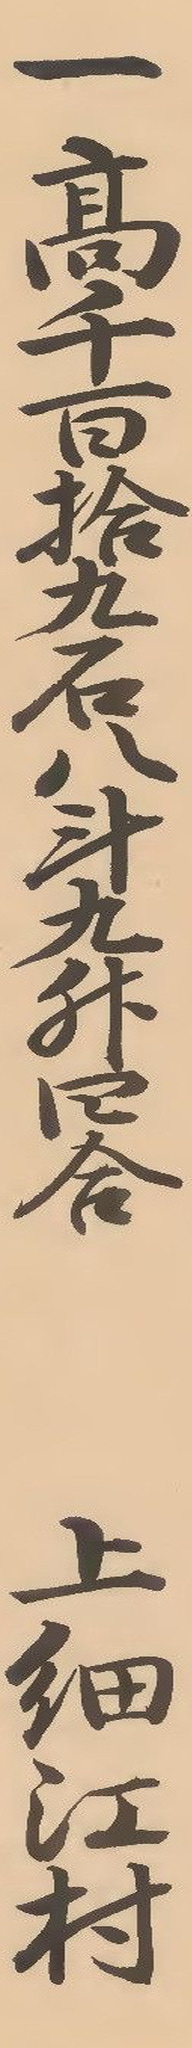一高千百拾九石八斗九升四合上細江村

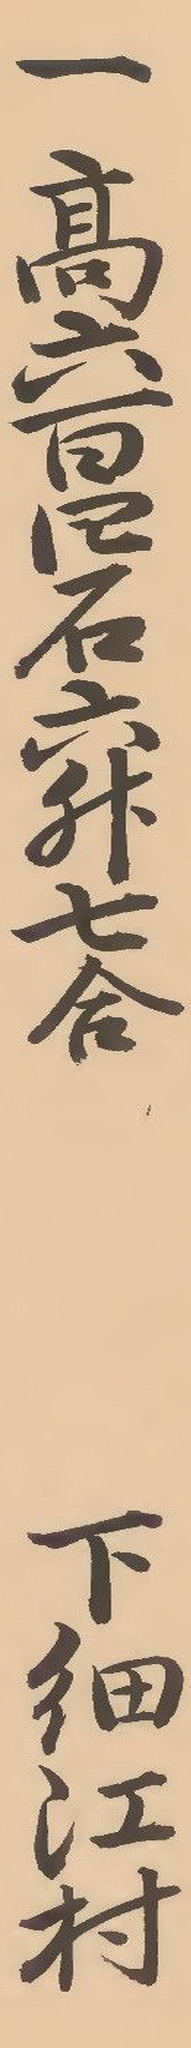一高六百四石六升七合下細江村
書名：越前国郷帳
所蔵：国立公文書館 National Archives of Japan
